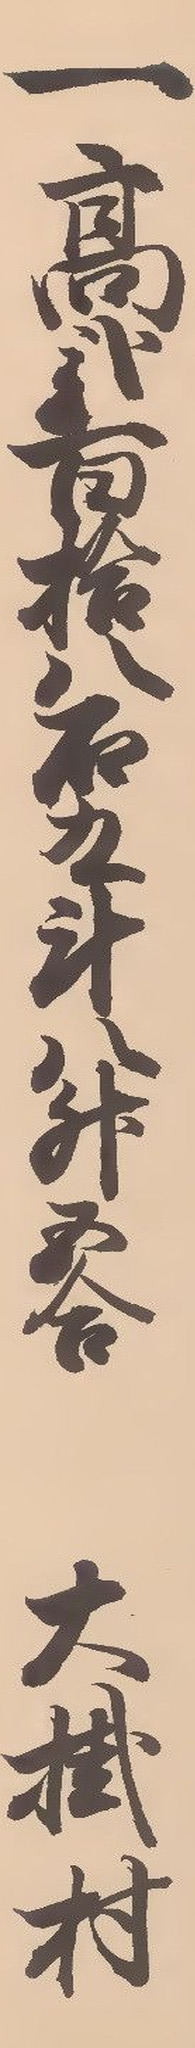一高弐百拾八石九斗八升五合大掛村
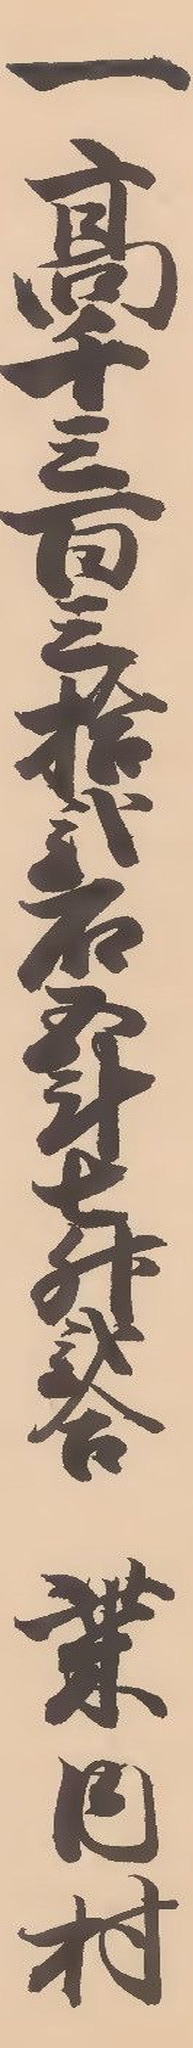一高千三百三拾弐石五斗七升弐合柴内村
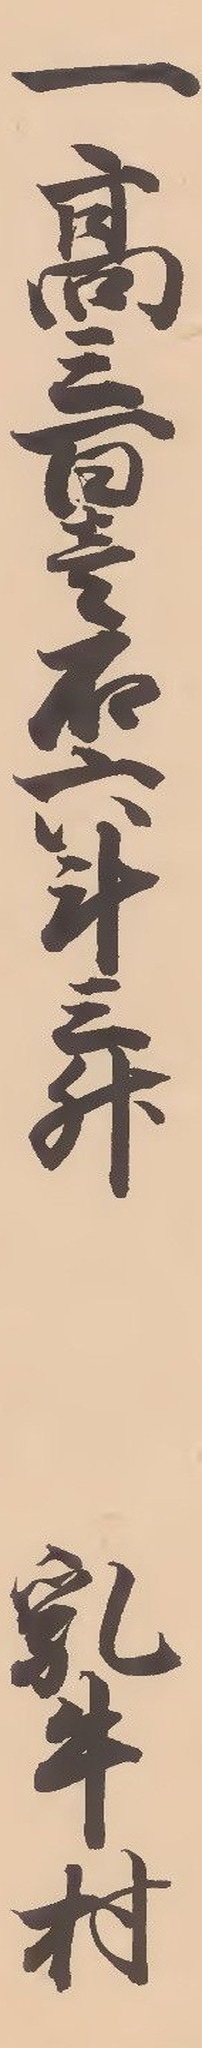一高三百壱石六斗三升乳牛村
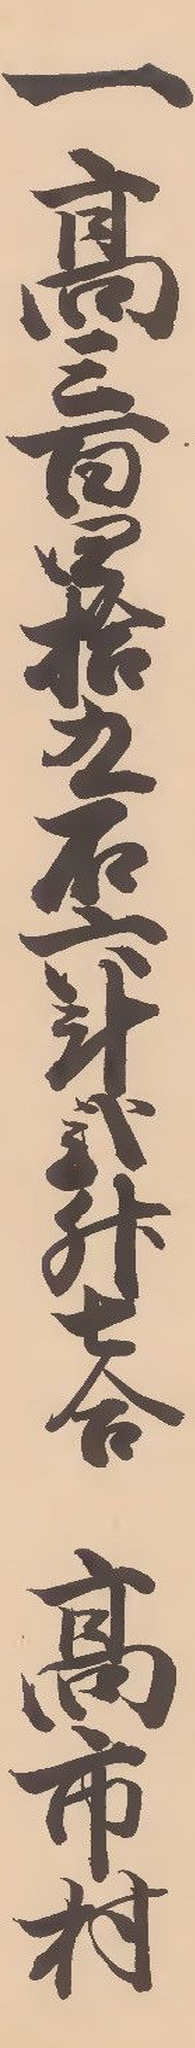一高三百四拾九石六斗弐升七合高市村

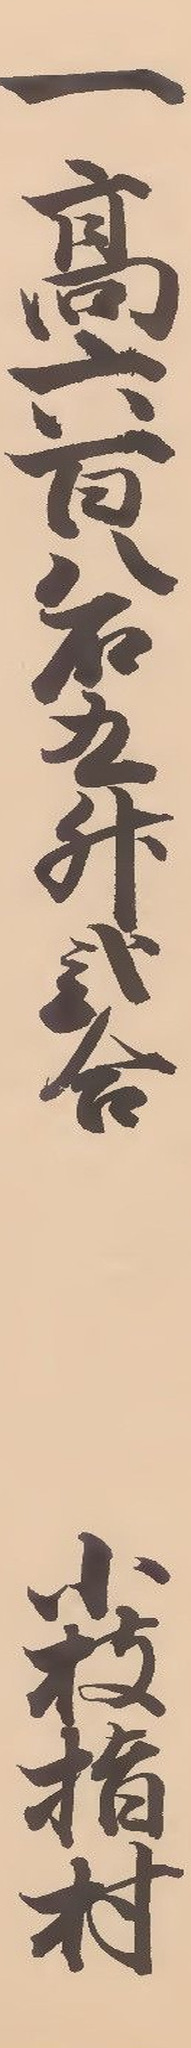一高六百八石九升弐合小枝指村
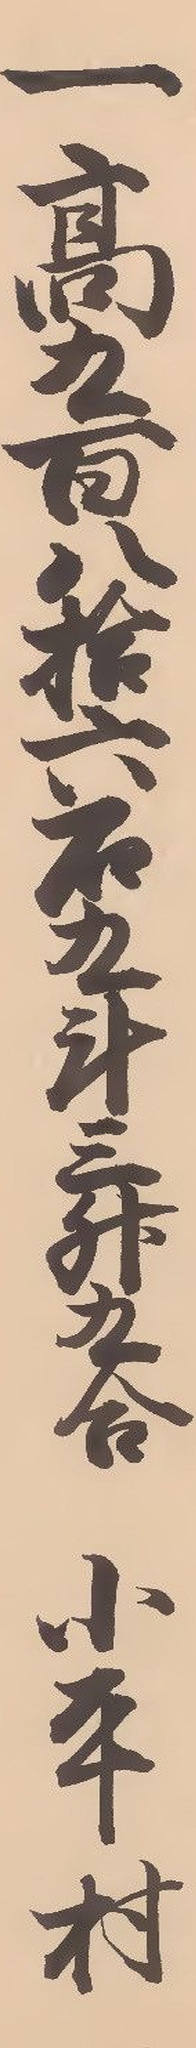一高九百八拾六石九斗三升九合小平村
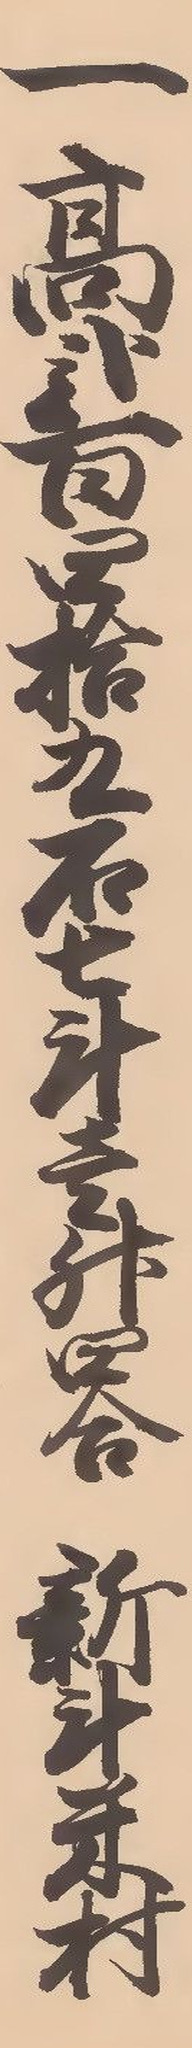一高弐百四拾九石七斗壱升四合新斗米村
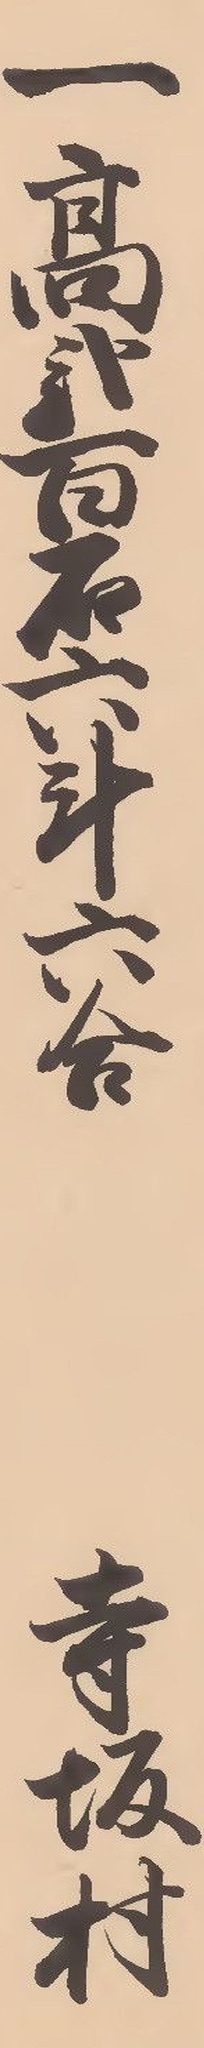一高弐百石六斗六合寺坂村
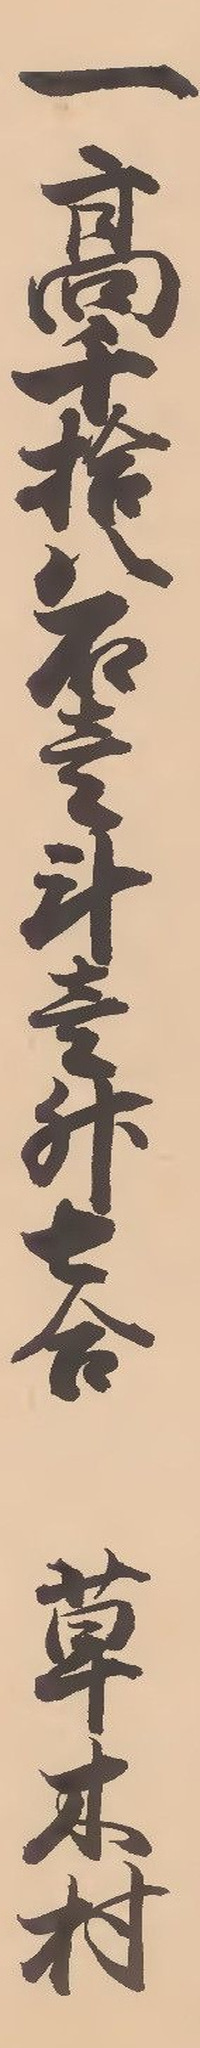一高千拾八石壱斗壱升七合草木村
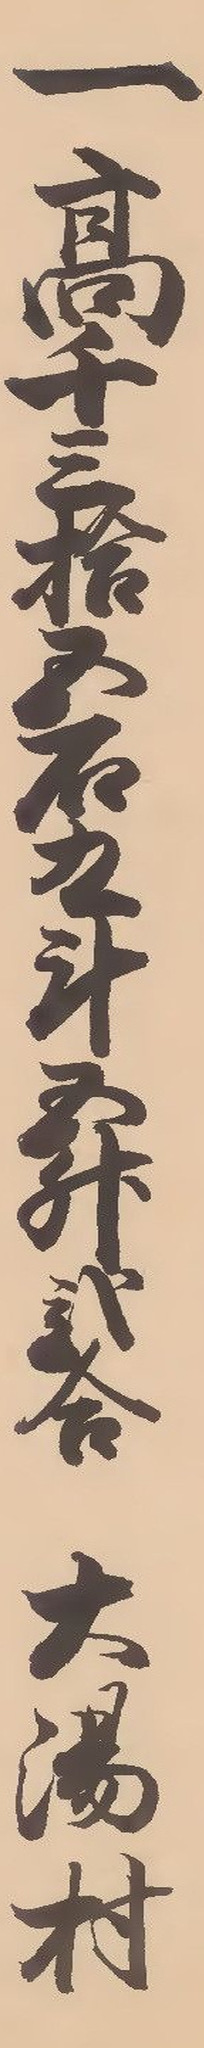一高千三拾五石九斗五升弐合大湯村
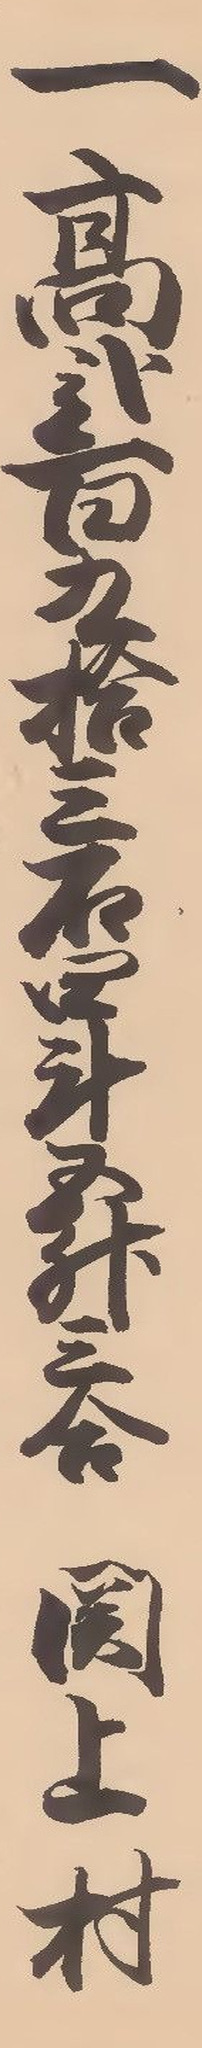一高弐百九拾三石四斗五升三合関上村
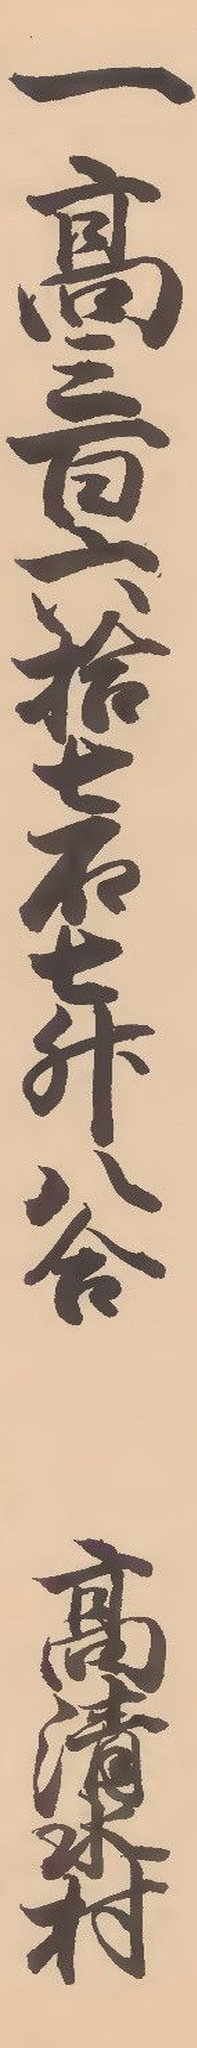一高三百六拾七石七升八合高清水村

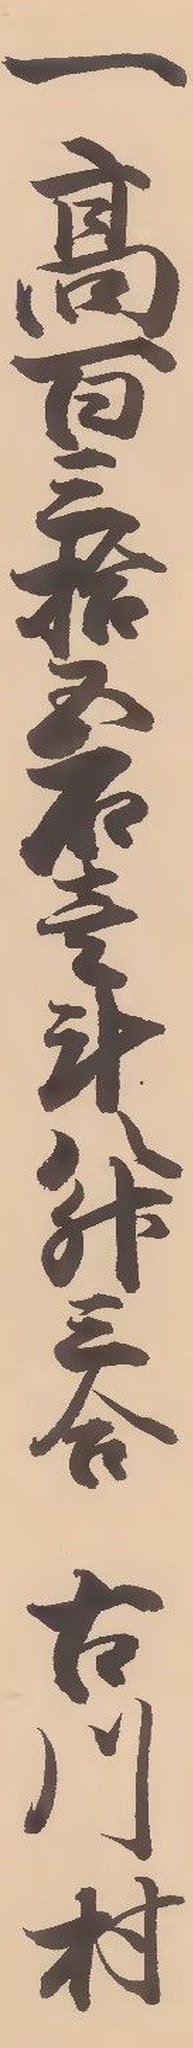一高百三拾五石壱斗八升三合古川村
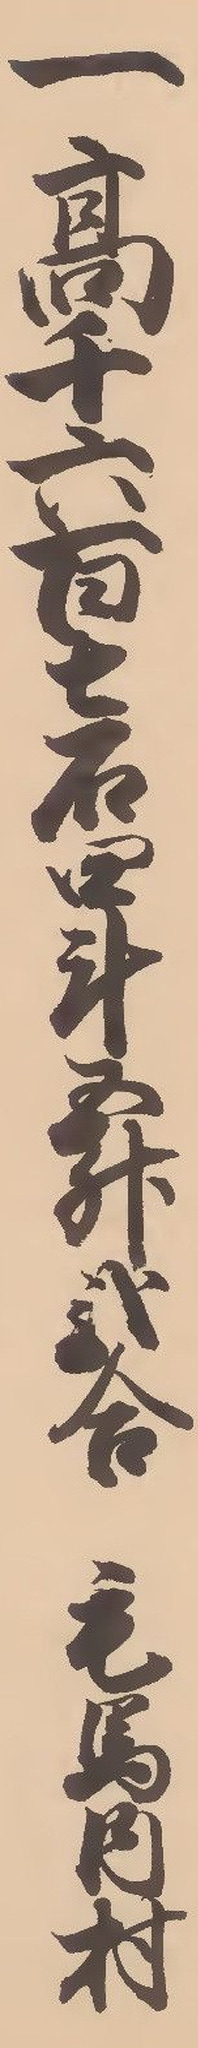一高千六百七石四斗五升弐合毛馬内村
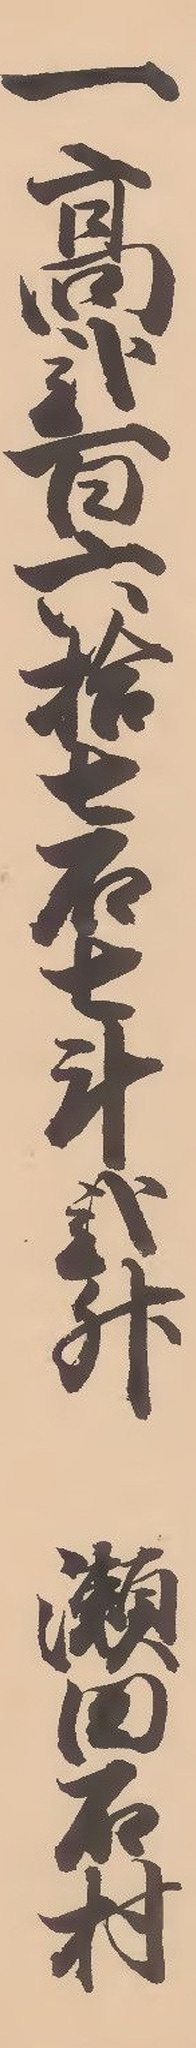一高弐百六拾七石七斗弐升瀬田石村
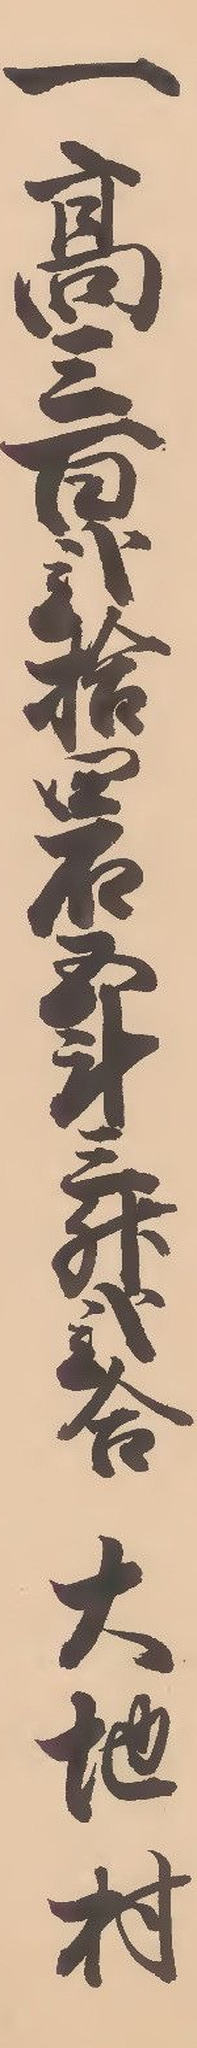一高三百弐拾四石五斗三升弐合大地村
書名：陸奥国郷帳　６
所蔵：国立公文書館 National Archives of Japan
